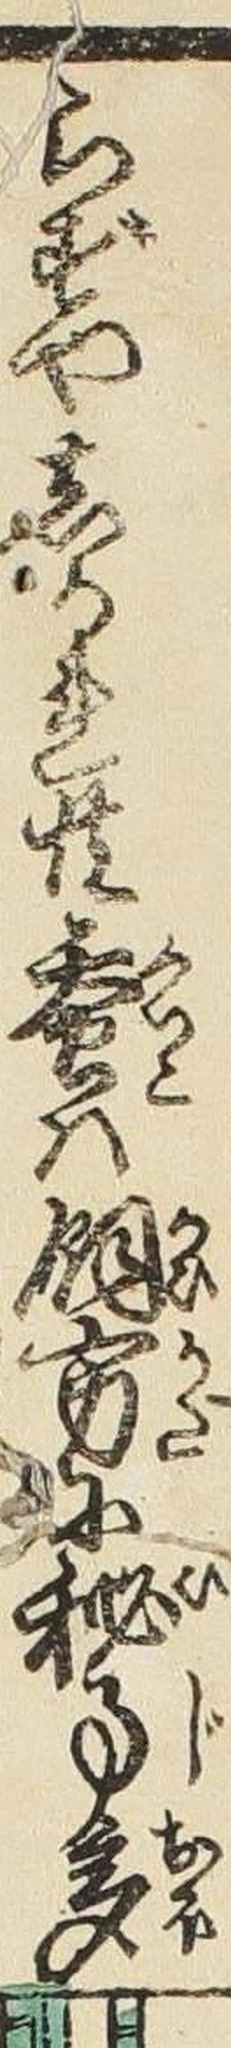らずやしるれ共蚕は飼方に秘事多
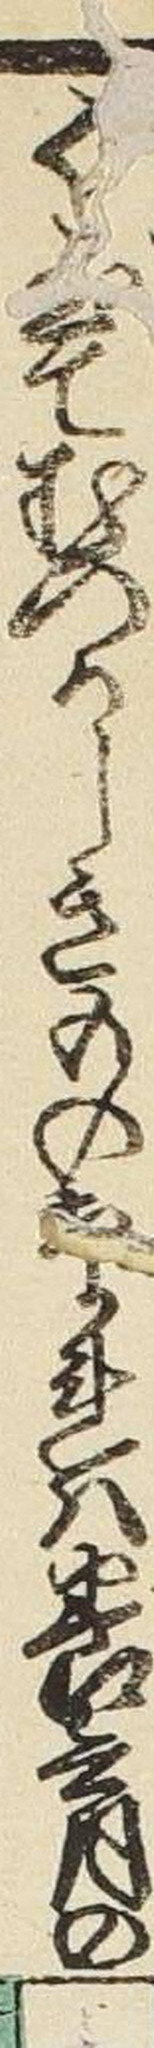く至てむつかしきものなれは養育の
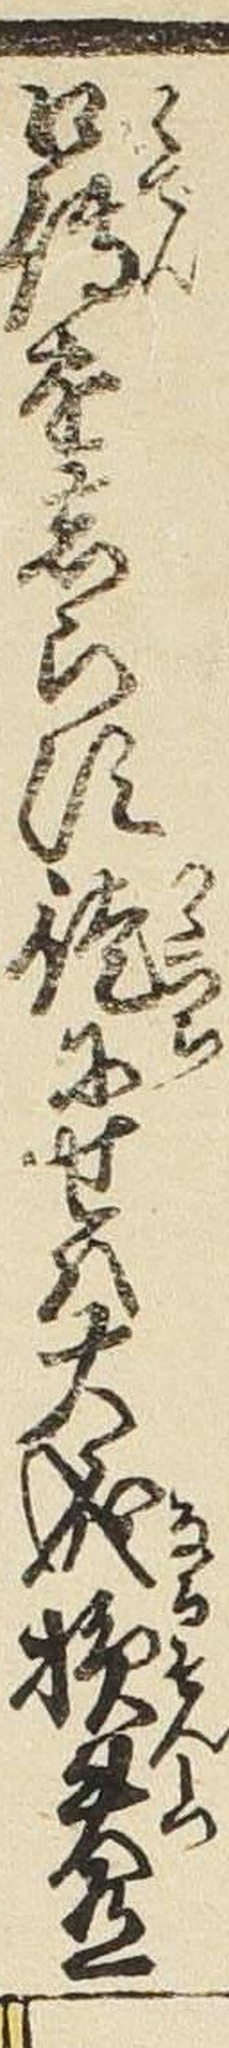口伝をしらす徒にせは大成損失有
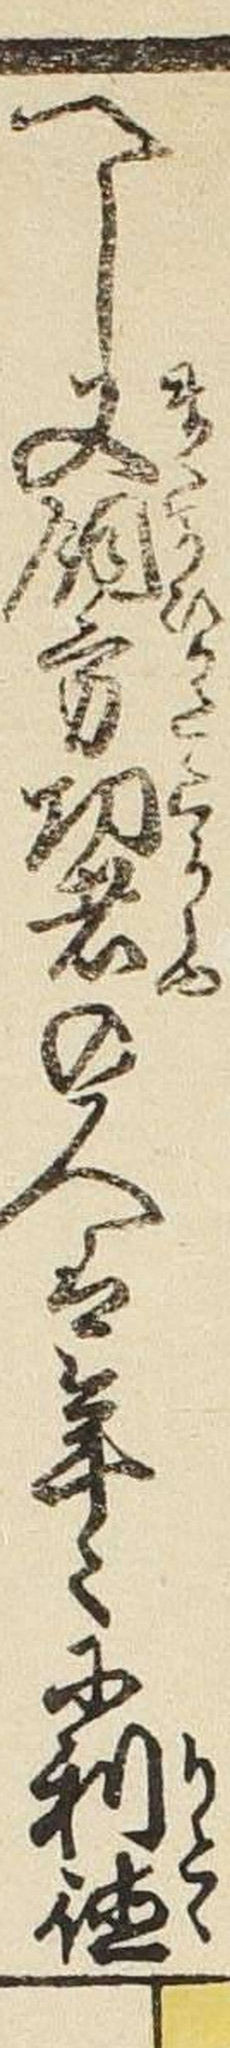へし又飼方功者の人は年々に利徳
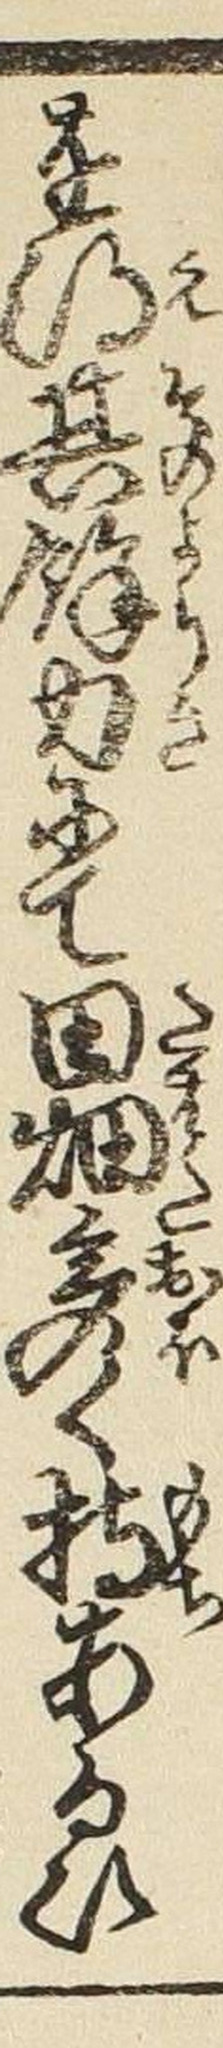を得其余力にて田畑多く持あるひ
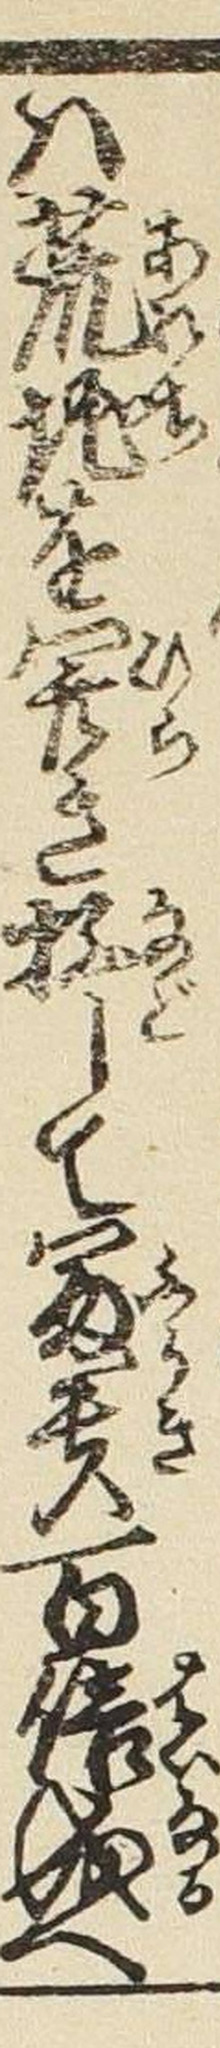は荒地を開き抔して富貴百倍成へ
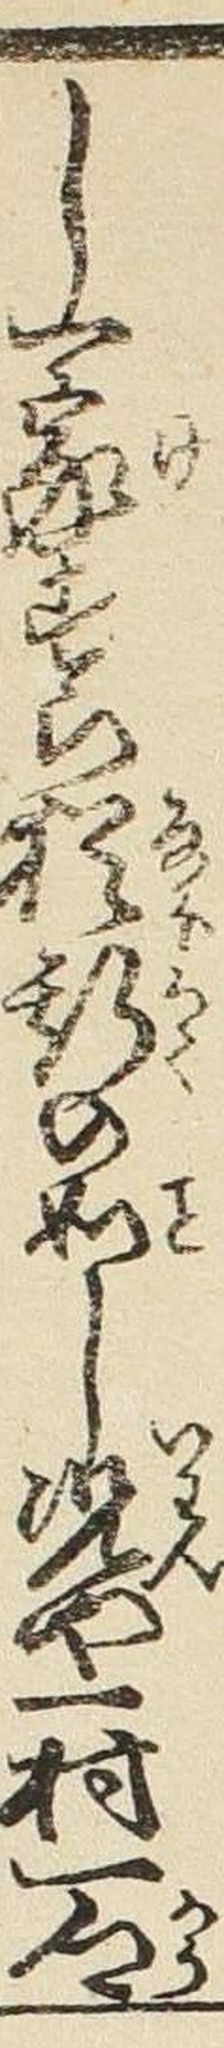し一家すら猶斯の如し況や一村一郷
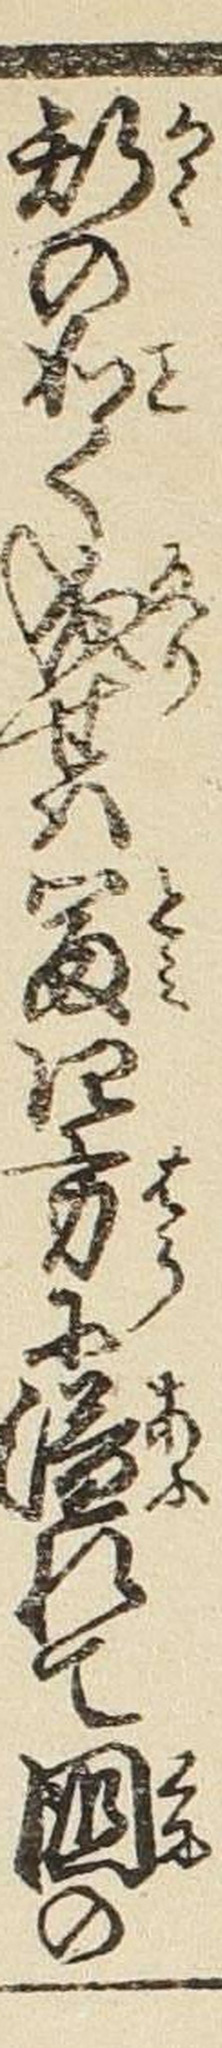斯の如く成其富四方に溢れて国の
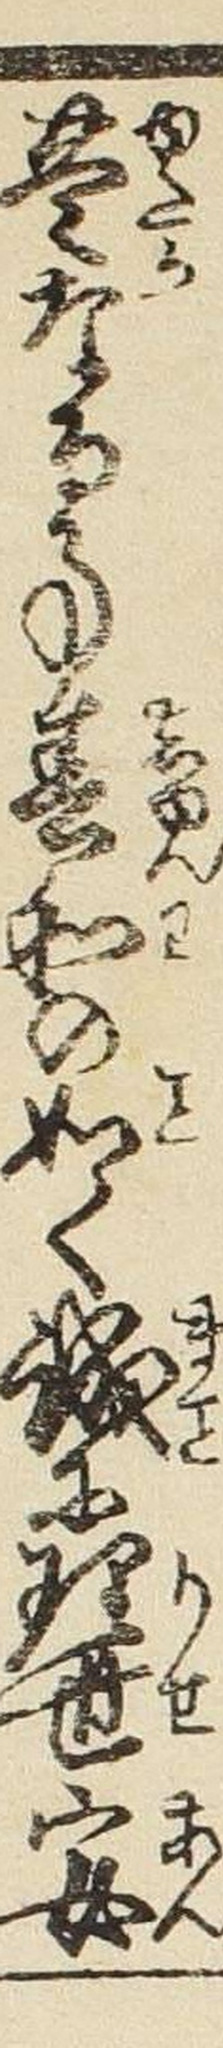豊なる事春和の如く誠に理世安
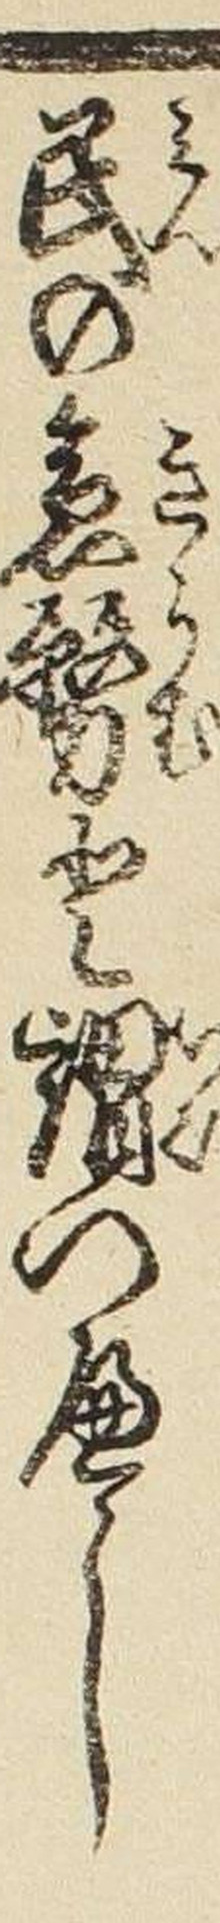民の急務と謂つへし
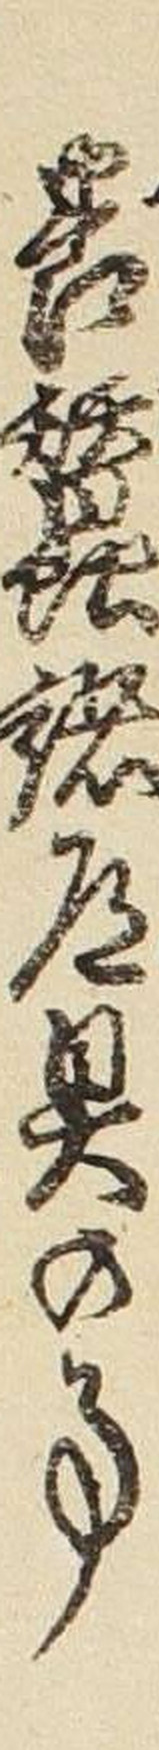養蚕諸道具の事
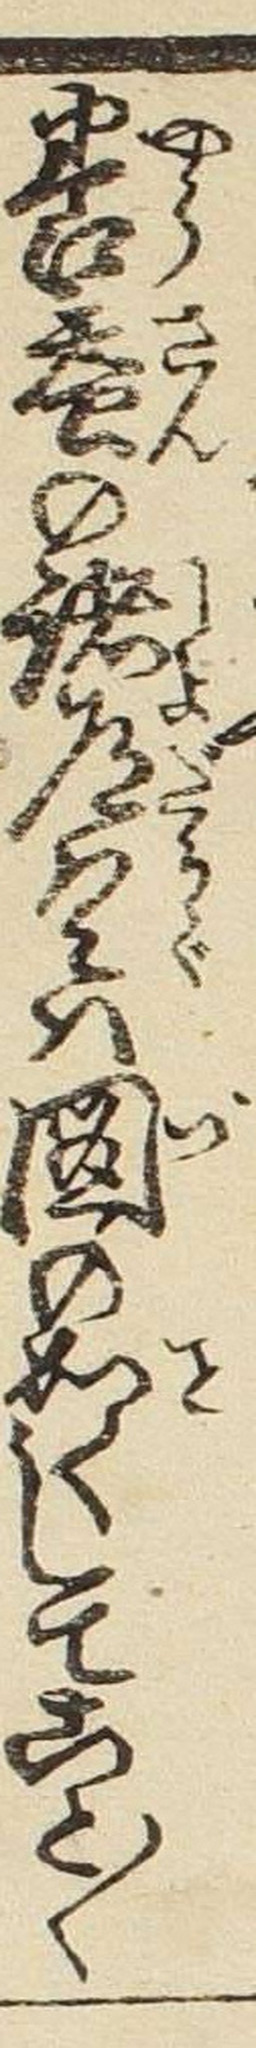養蚕の諸道具は図の如くしてこと〳〵
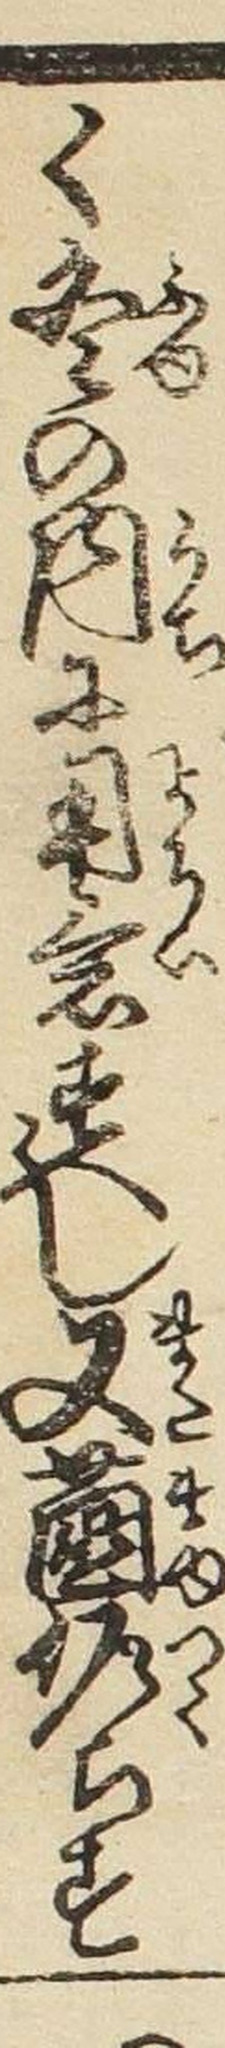く冬の内に用意すへし又繭作らす
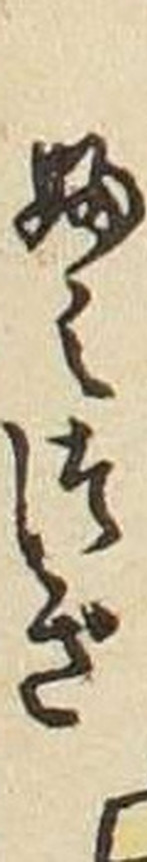ふみつぎ

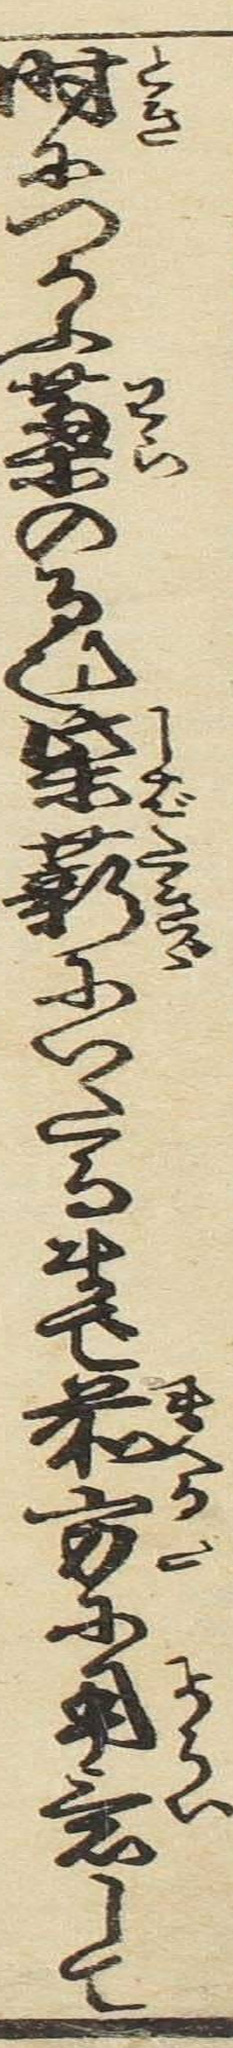時につかふ藁のるい柴薪にいたるまで前方に用意して
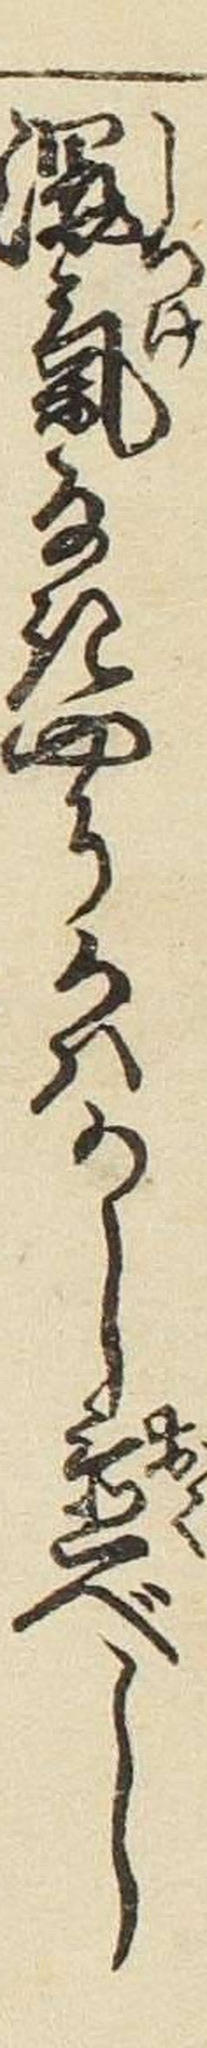湿気なきやうかはかし置べし
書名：養蠶圖解
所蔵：東京大学農学生命科学図書館 国文学研究資料館
